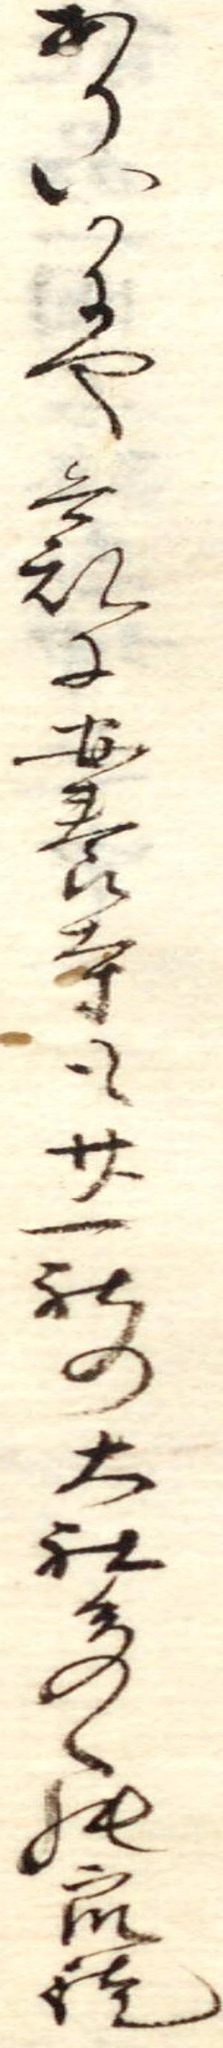ありいかにや兵乱に安養寺も廿一社の大社多くの衆徒
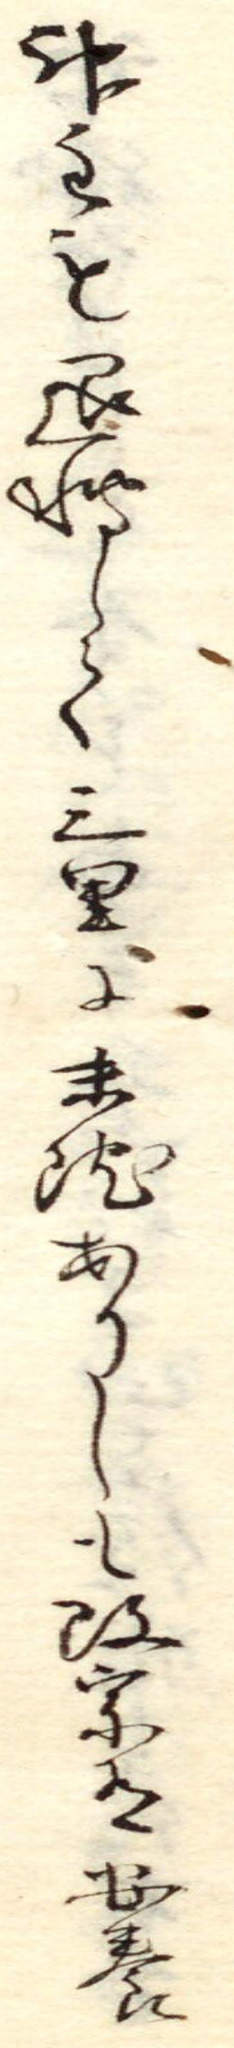神主も退転して三里に末院ありしも改宗有安養
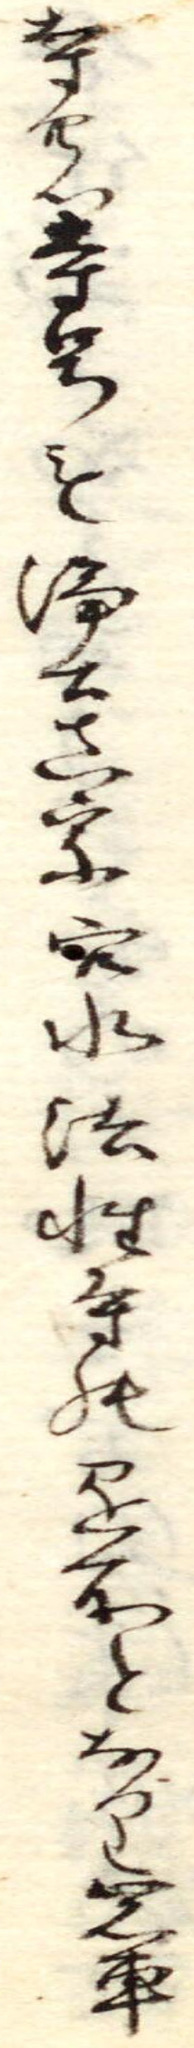寺の寺号も浄土真宗穴水法性寺の懸所となり岩車
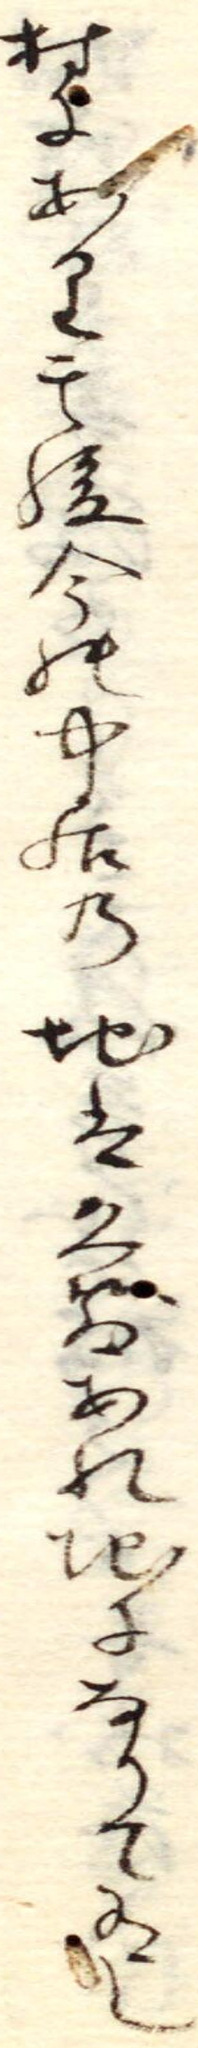村にあり其後今の中居の地は久敷あれ地になりて有し
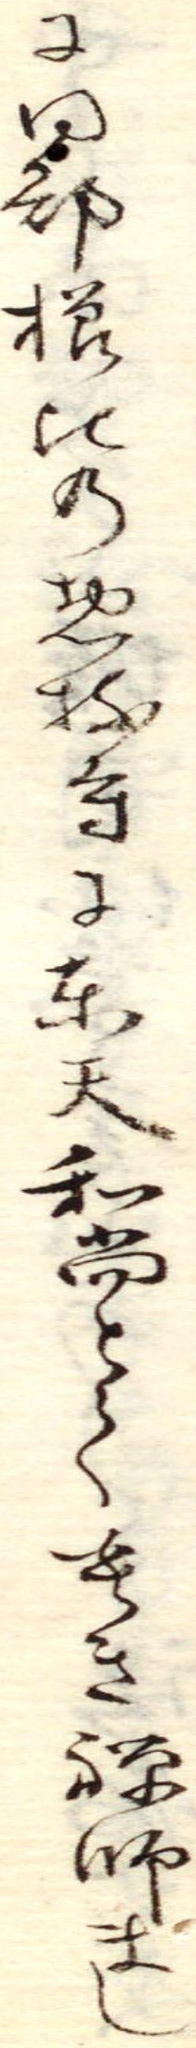に同郡櫛比の総持寺に東天和尚とて貴き禅師まし
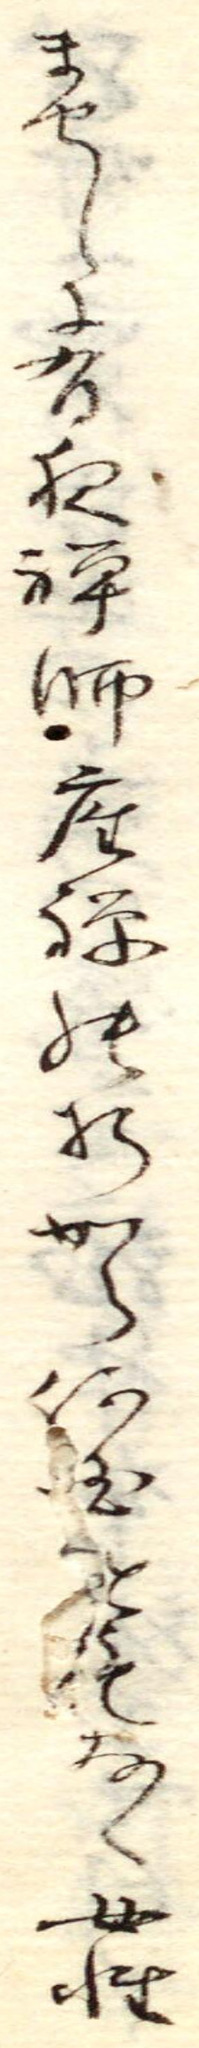ませしに有夜禅師座禅の折から何国ともなく女性
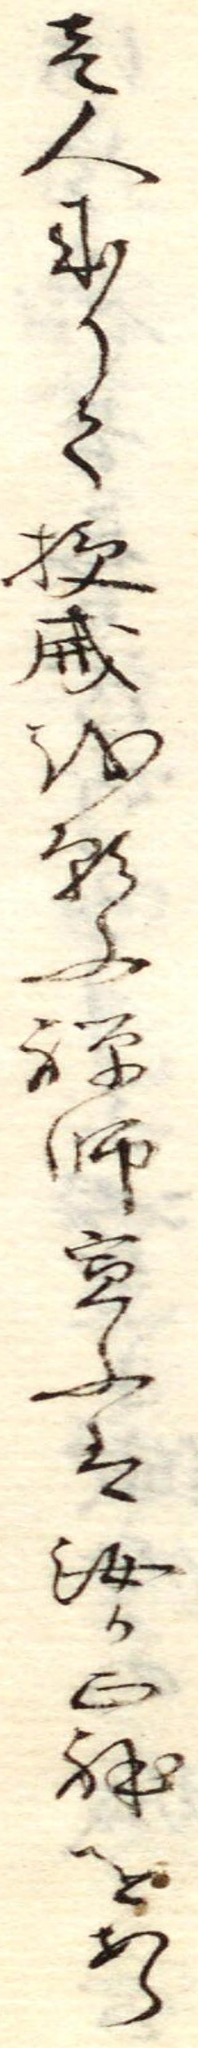壱人来りて授戒を願ふ禅師宣ふは汝か正躰をあら
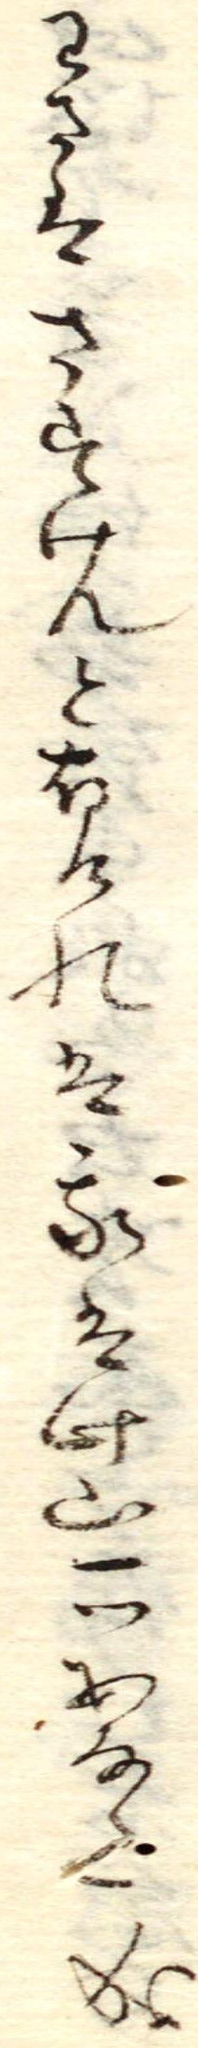わさはさすけんと有けれは我は此山一つあなた成
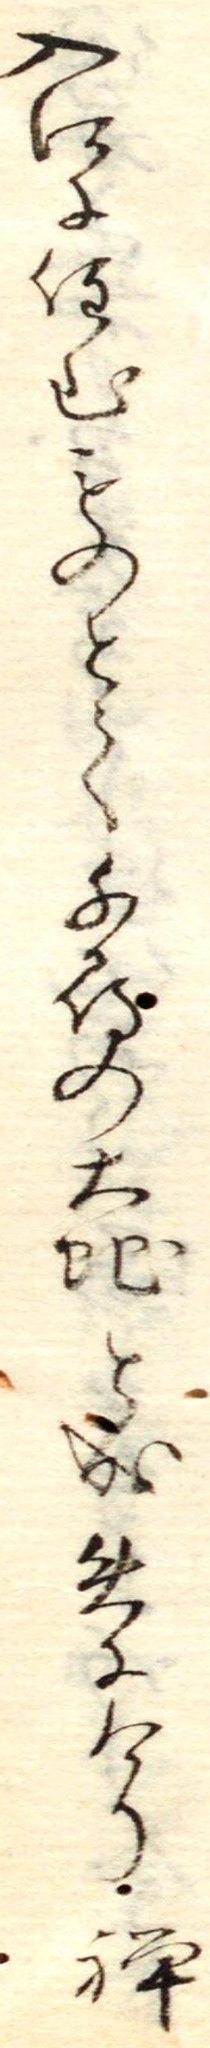入口に住むものとて千尋の大蛇と成失にけり
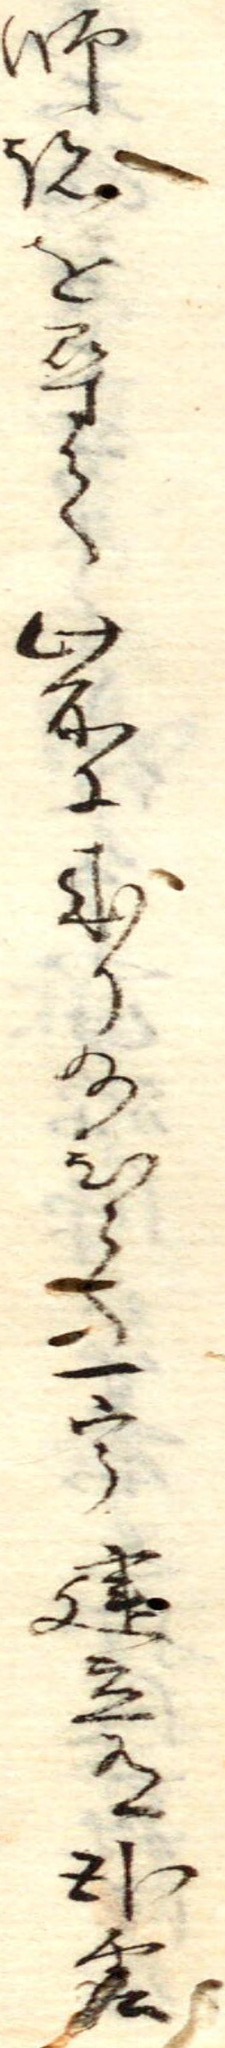師跡を尋て此所に来り給ひて一宇建立有臥雲

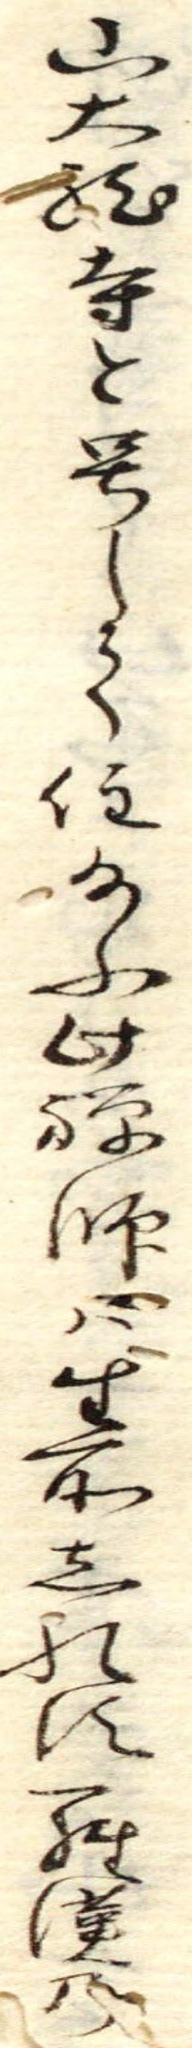山大龍寺と号して住給ふ此禅師は生前しれす羅漢の
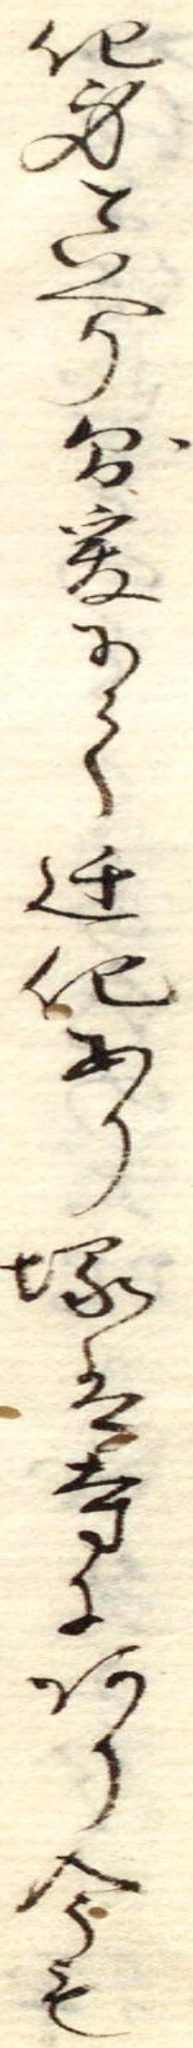化身といへり則爰にて迁化あり塚は寺にあり今も
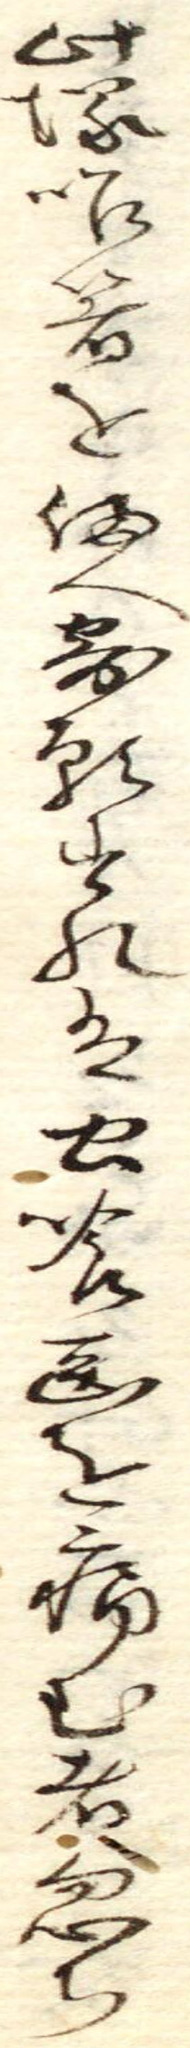此塚咋箸を備へ寄願すれは虫喰歯を痛む者は忽ち
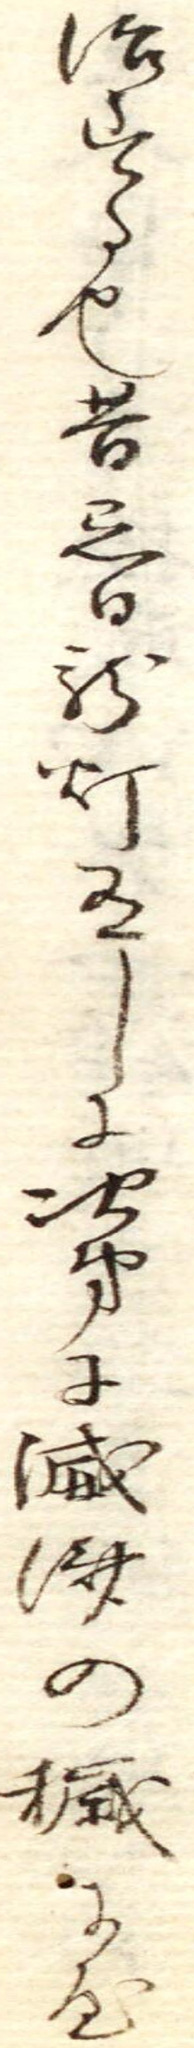治する也昔忌日龍灯有しに次第に減済の穢にや
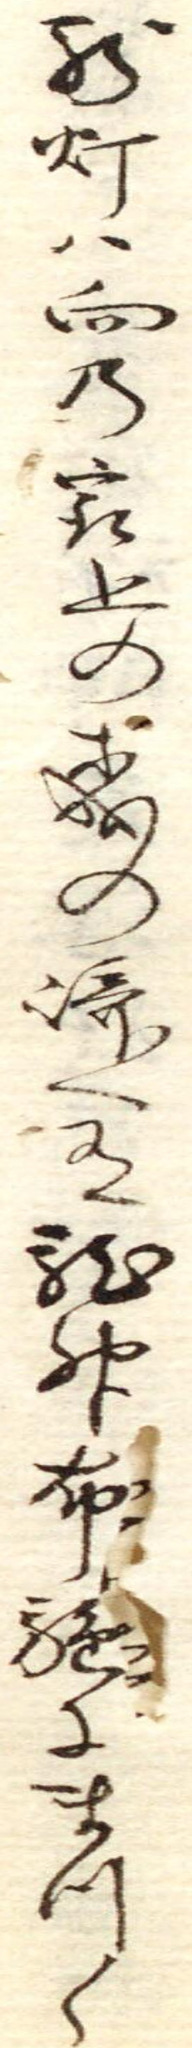龍灯は向の最上の森の崎へ有龍神布施にまつて
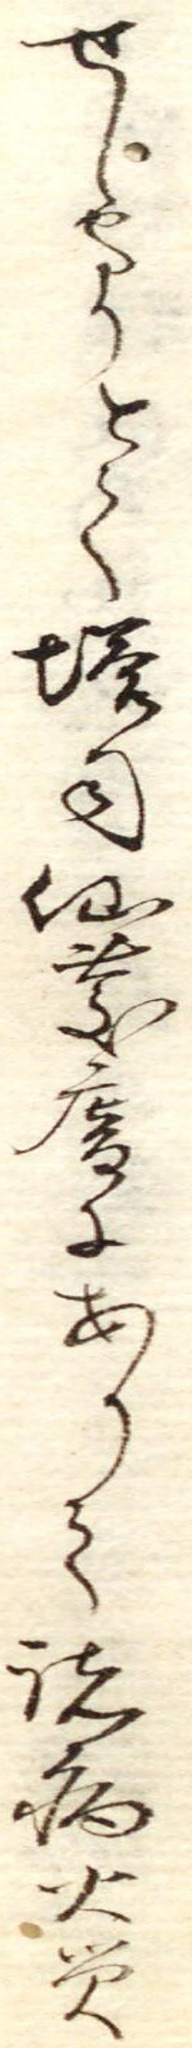せし守りとて塔司仙慶庵にありて諸病火災
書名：能登名跡誌
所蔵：Ishikawa Prefectural Library
